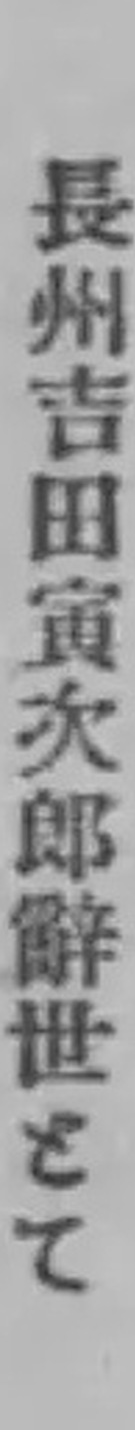長州吉田寅次郎辞世とて
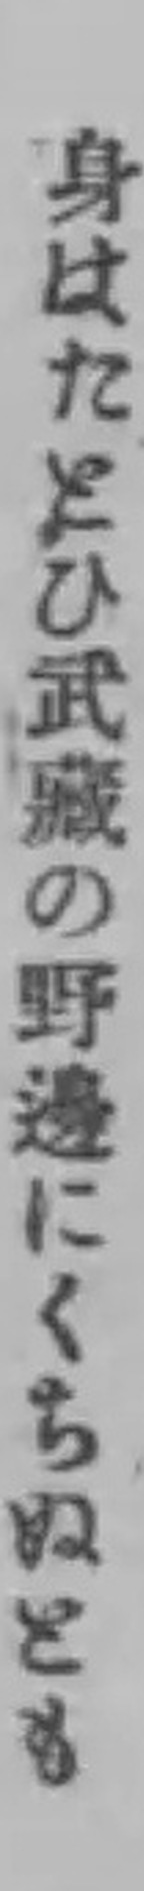身はたとひ武蔵の野辺にくちぬとも
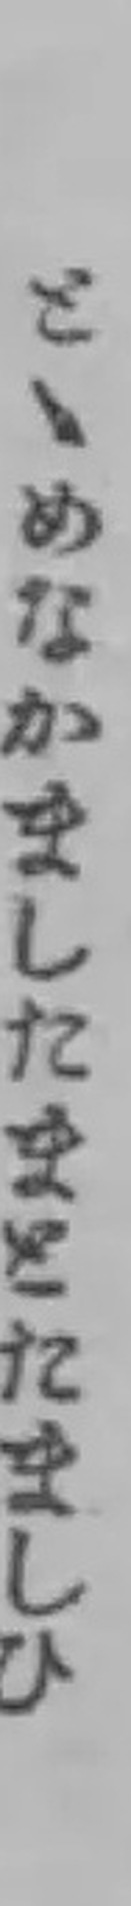とゝめなかましたまとたましひ
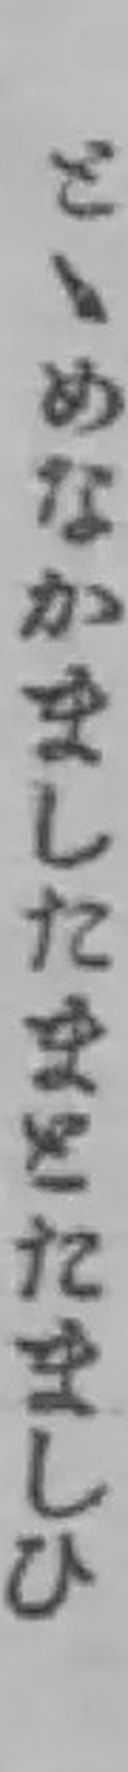とゝめなかましたまとたましひ
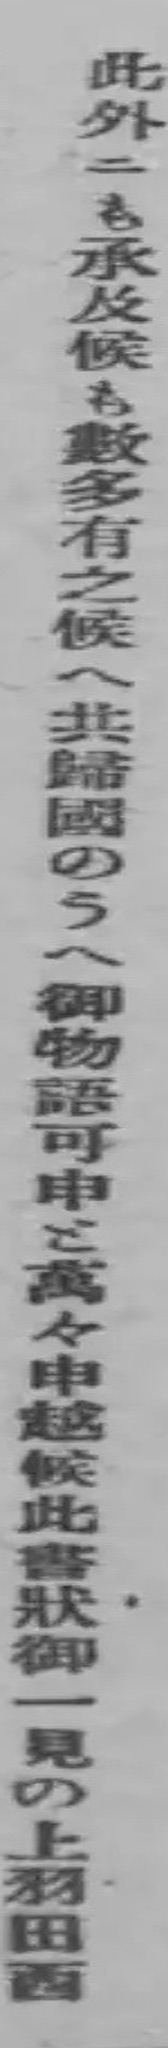此外ニも承及候も数多有之候へ共帰国のうへ御物語可申と萬々申越候此書状御一見の上羽田西
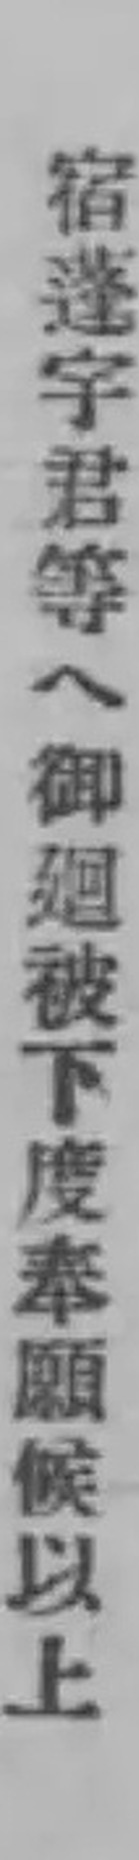宿蓬宇君等へ御廻被下度奉願候以上
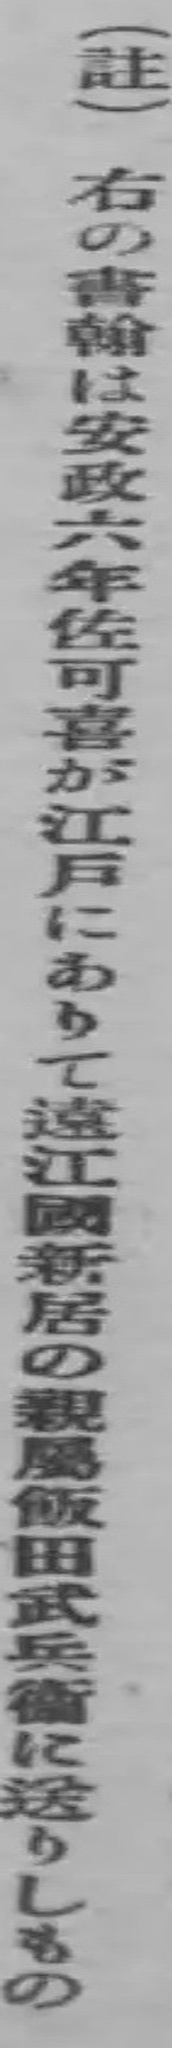(註)右の書翰は安政六年佐可喜が江戸にありて遠江国新居の親属飯田武兵衛に送りしもの
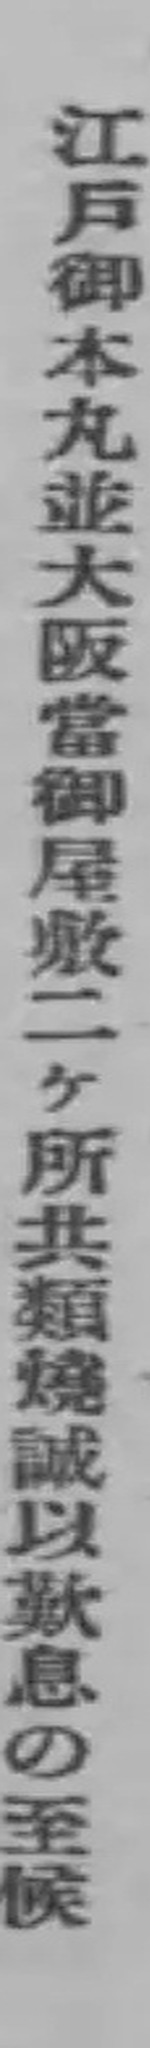江戸御本丸並大阪当御屋敷二ケ所共類焼誠以歎息の至極
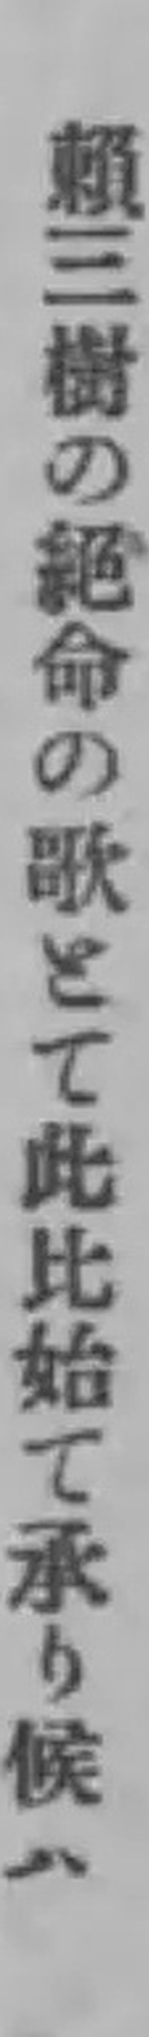頼三樹の絶命の歌とて此比始て承り候は
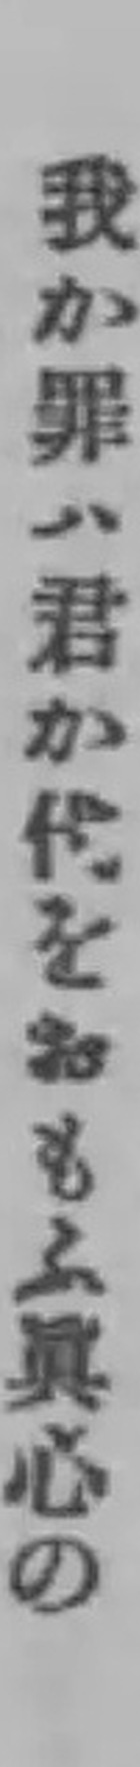我か罪は君か代をおもふ真心の
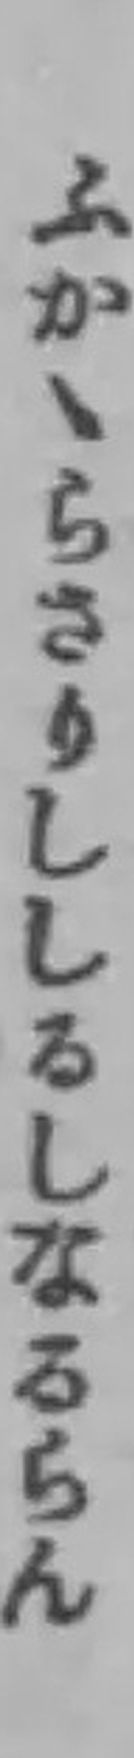ふかゝらさりししるしなるらん
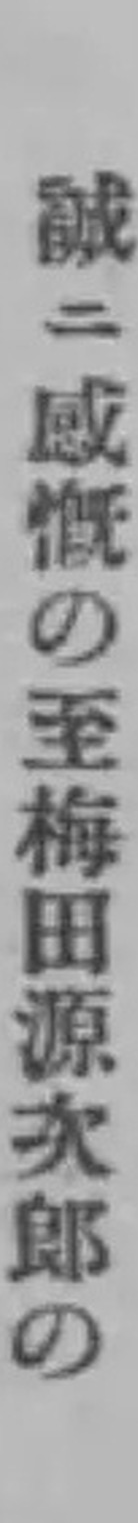誠ニ感慨の至梅田源次郎の
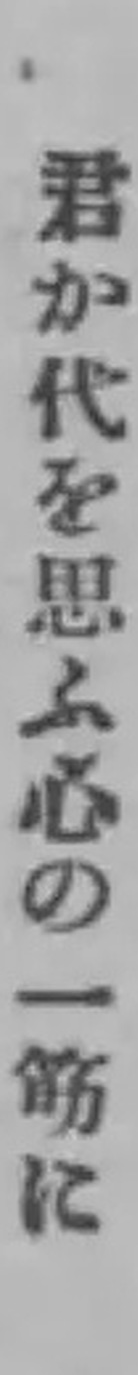君か代を思ふ心の一筋に
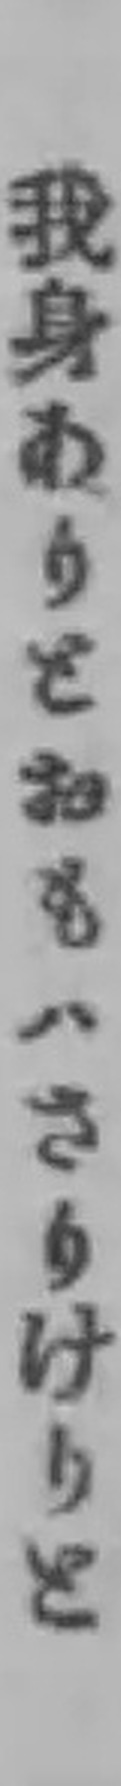我身ありとおもはさりけりと
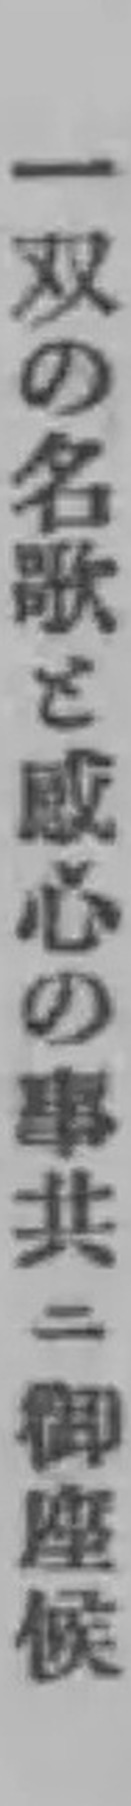一双の名歌と感心の事共ニ御座候
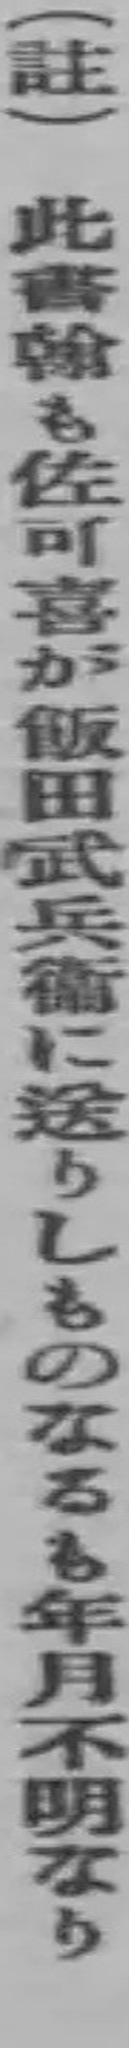(註)此書翰も佐可喜が飯田武兵衛に送りしものなるも年月不明なり
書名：豊橋市史談
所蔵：国立国会図書館 National Diet Library, JAPAN
